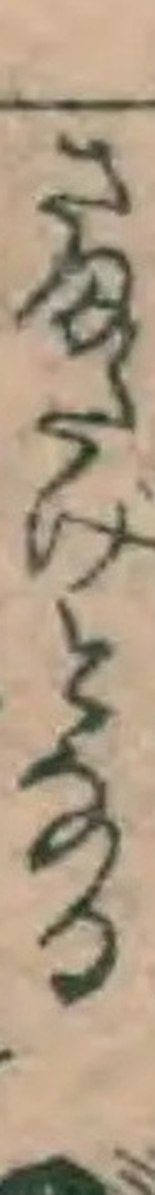さまたげとなる
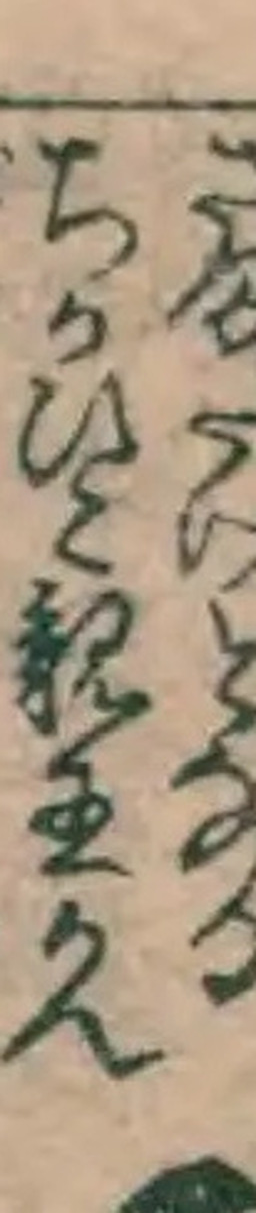ちかひと親王かん
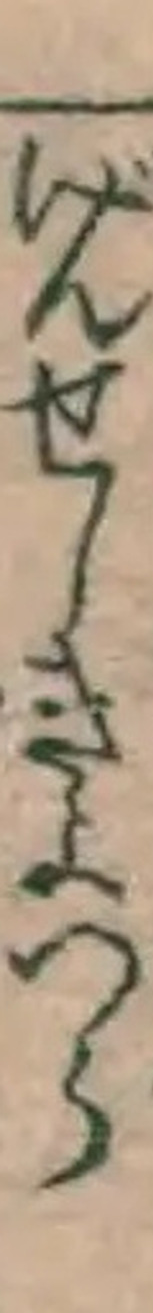げんせしきよつら
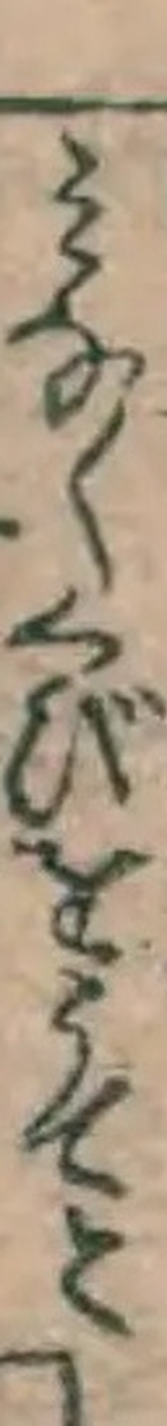みな〳〵くびをうてと
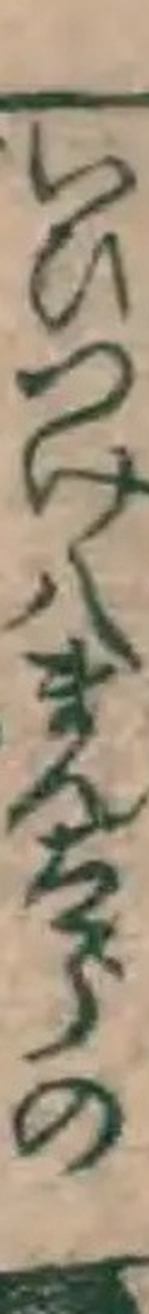いひつけ八まん太郎の
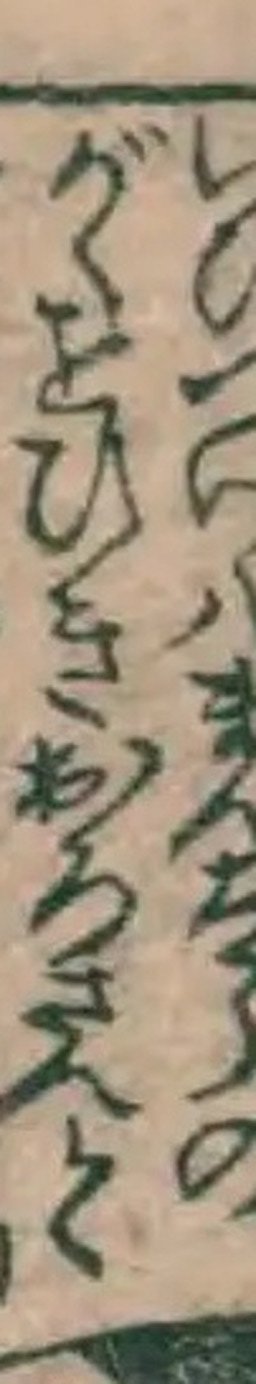がくをひきおろさんと
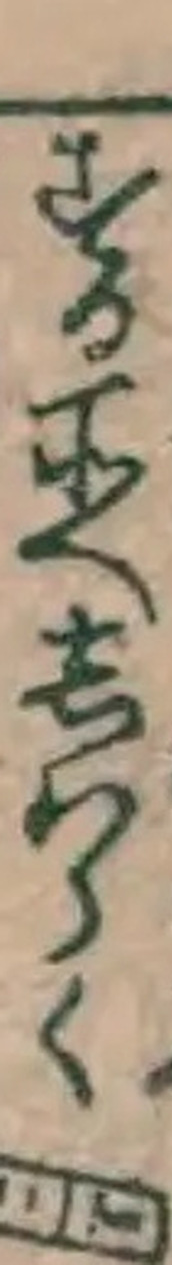する所へしはらく
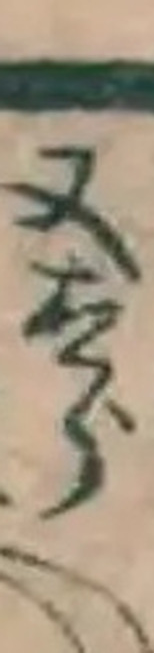又太郎
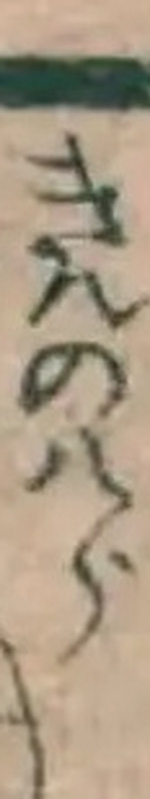きんの八郎
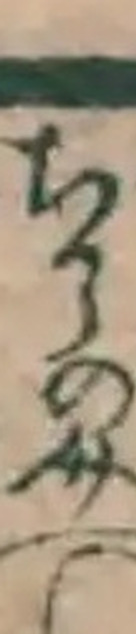ちからの介
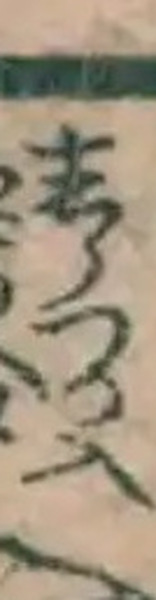しらつか入
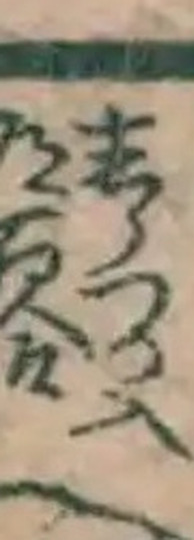しらつか入
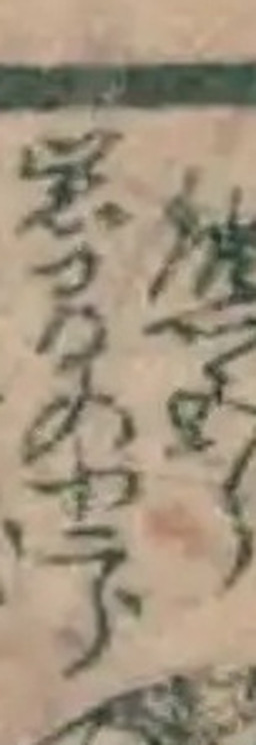岩間の小二郎

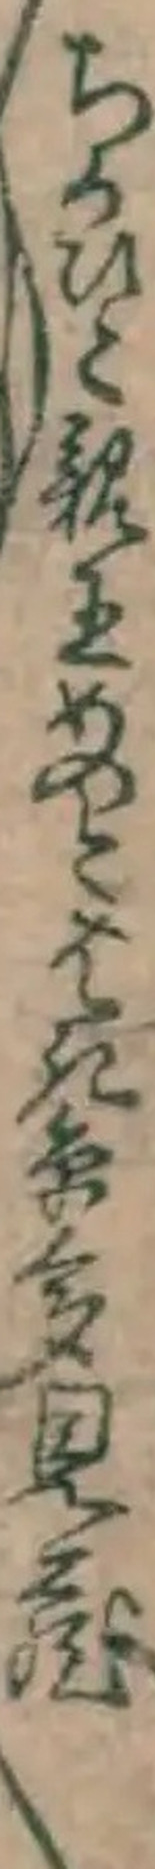ちかひと親王めのとはき原多見蔵
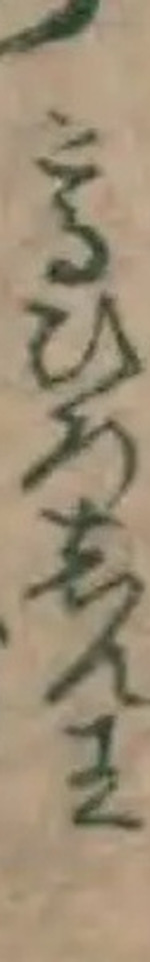高ひろしん王
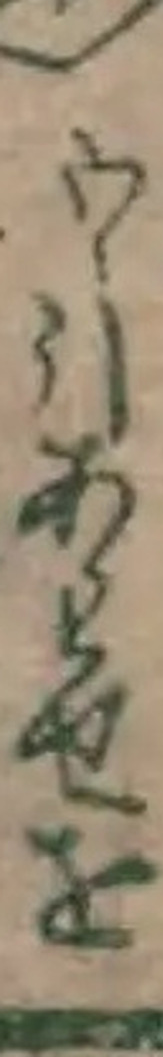ウー引あわせを
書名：伊達錦對将 : 森田座
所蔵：国立国会図書館 National Diet Library, JAPAN
